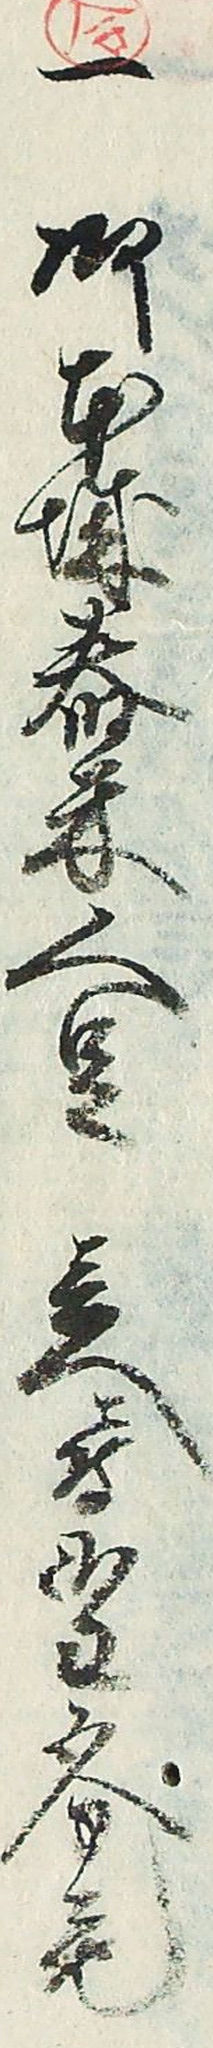一御本城舂米人足一人に付二匁五分宛
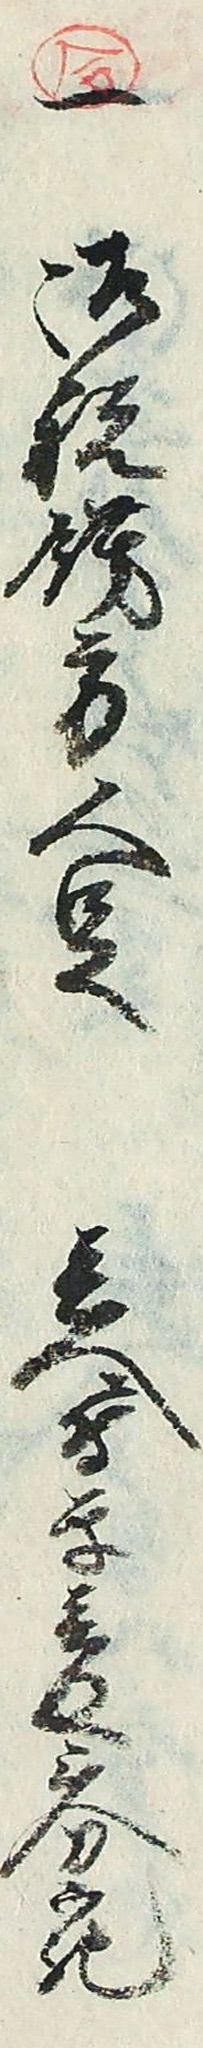一御祝錺方人足一人に付平一匁三分宛
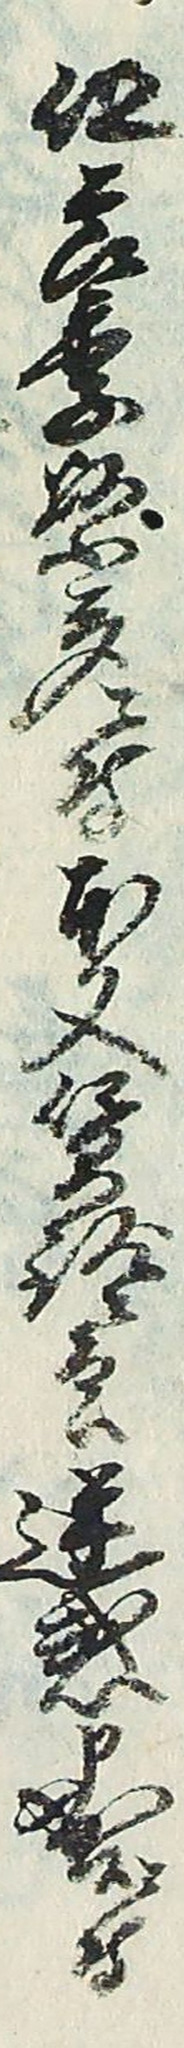但節季繁多に付本文賃銀にては迷惑申出候に付
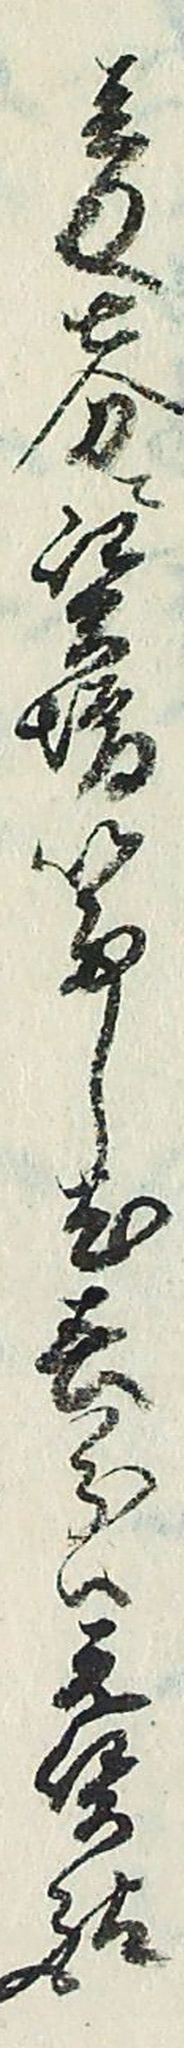一匁七分に賃増いたし尤春分は元賃銀
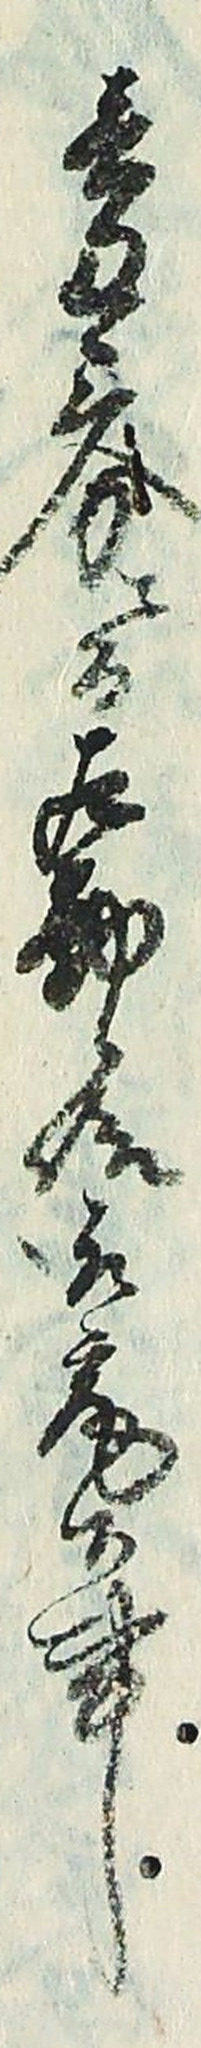一匁三分にて相勤候様取究候事
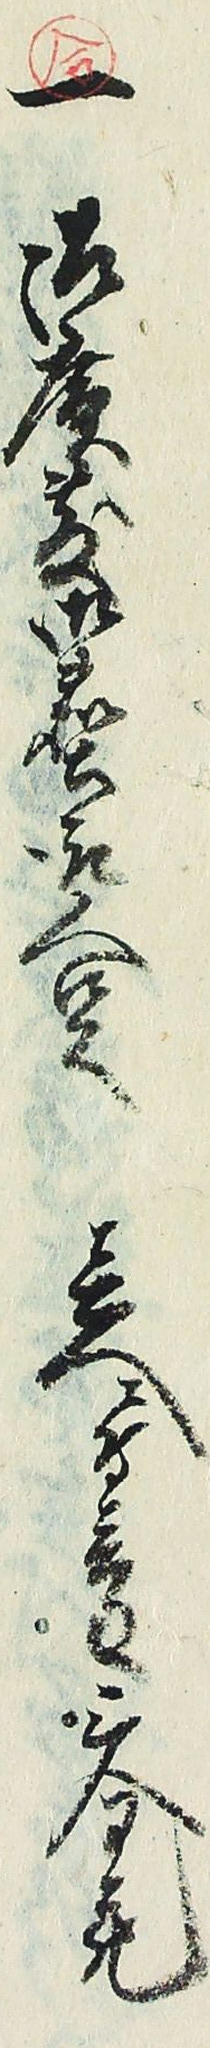一御広敷御塵取人足一人に付一匁三分宛
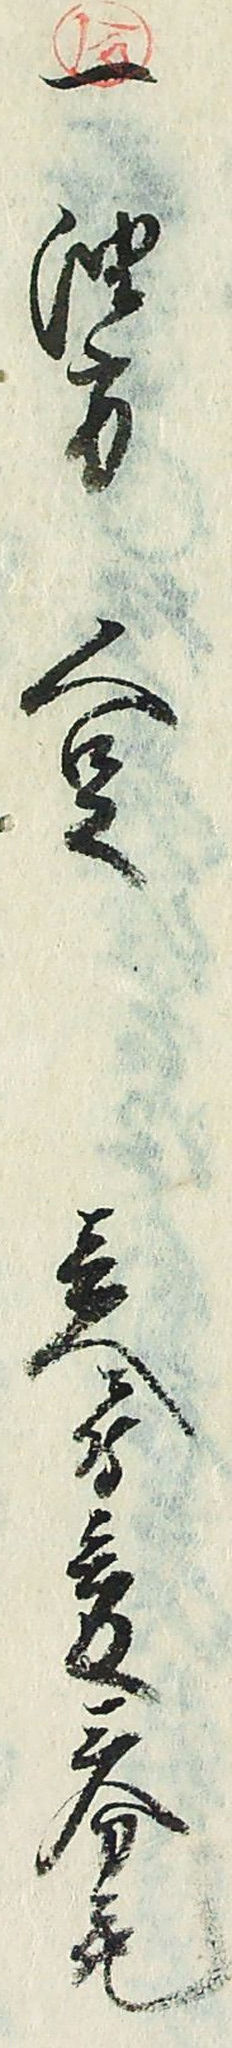一油方人足一人に付一匁三分宛
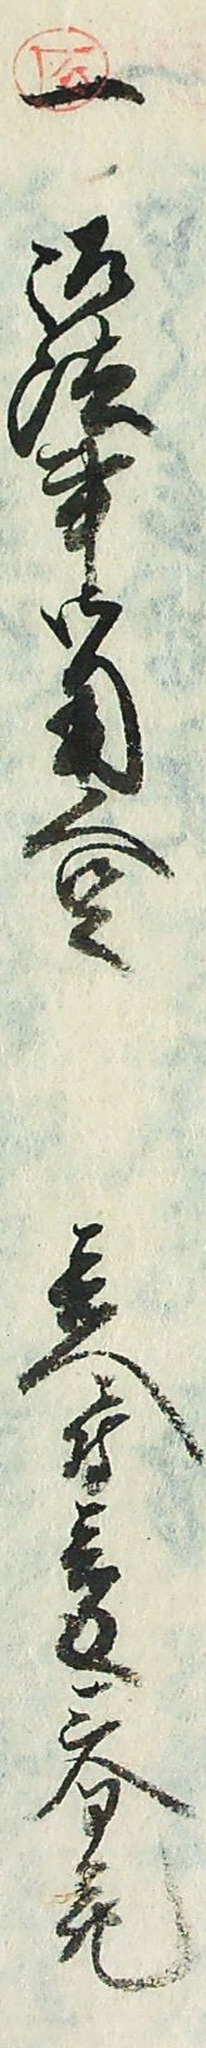一御法事御用人足一人に付一匁三分宛
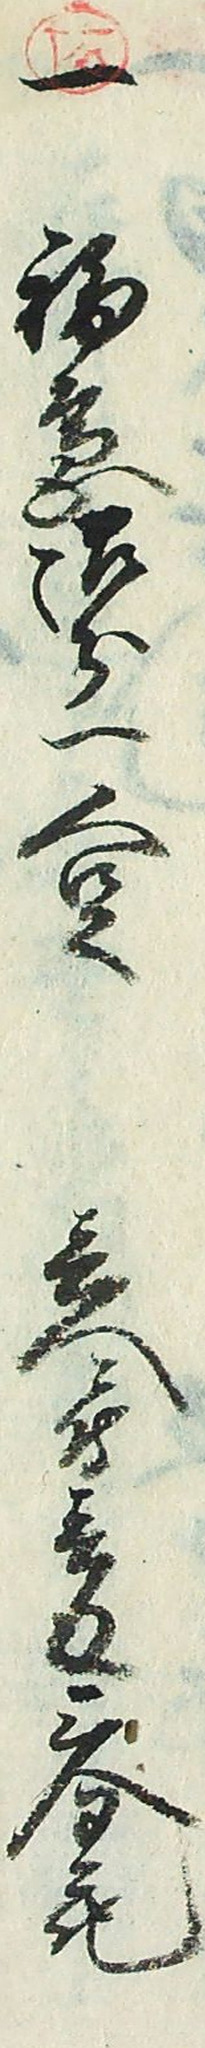一福島御分一人足一人に付一匁三分宛
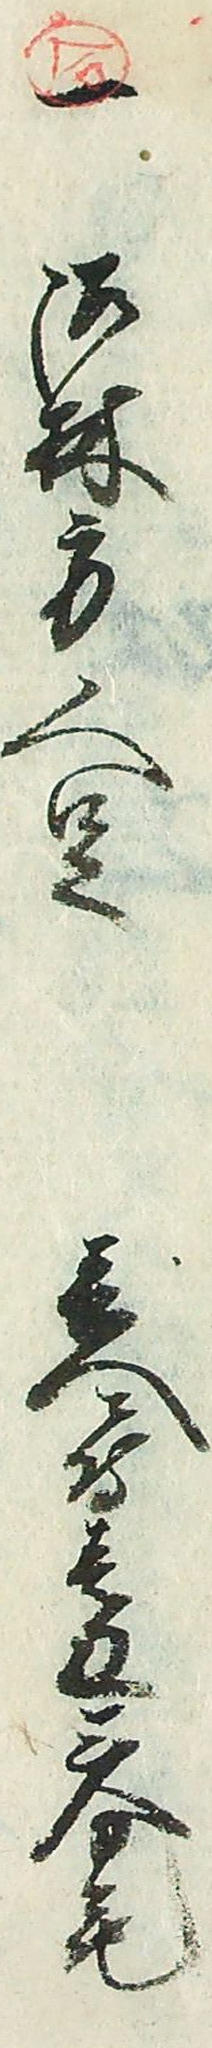一御林方人足一人に付一匁三分宛
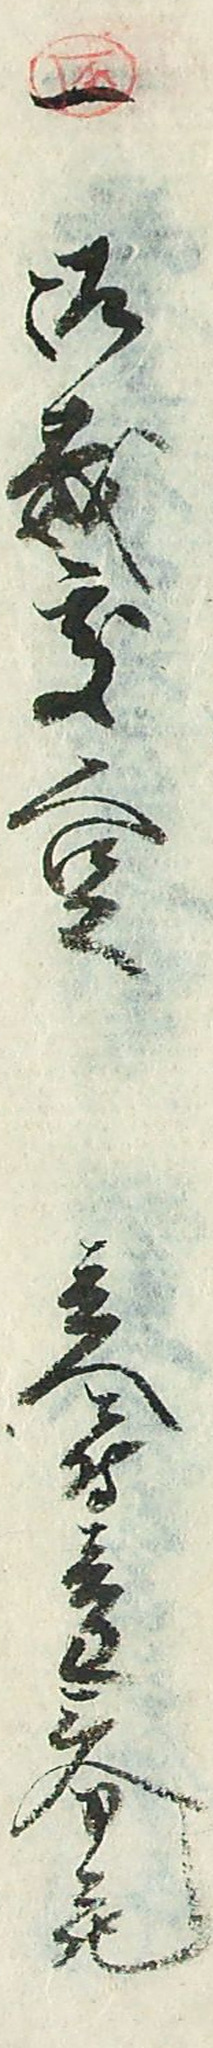一御蔵処人足一人に付一匁三分宛

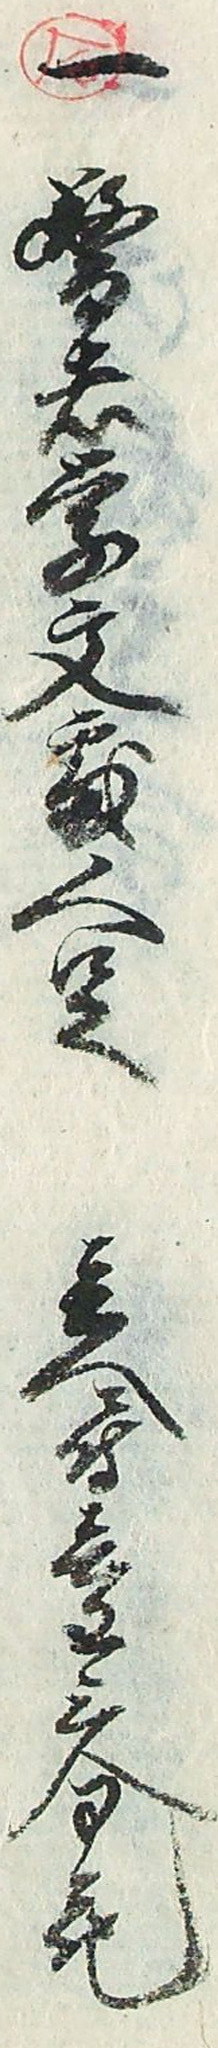一医者学文処人足一人に付一匁三分宛
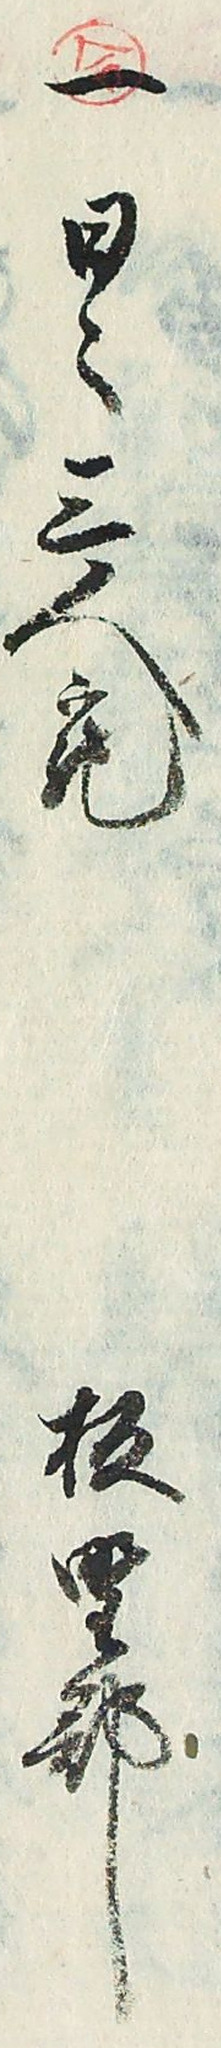一日々三人宛板野郡
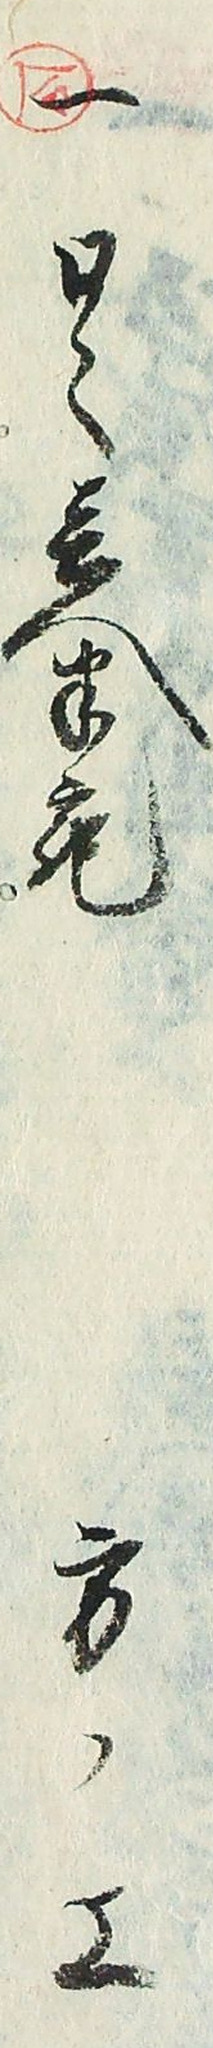一日々一人半宛方ノ上
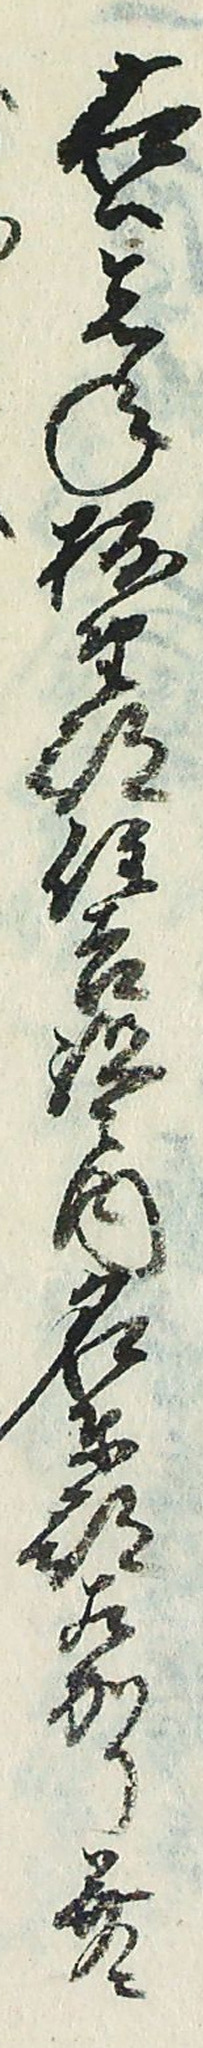右は先年板野郡住吉組の内名東郡相加り幷に
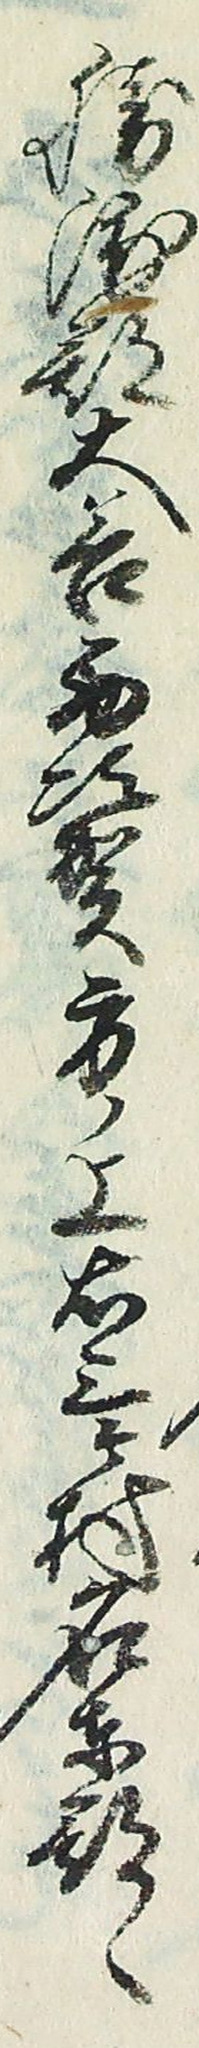勝浦郡大谷西須賀方ノ上右三ヶ村名東郡へ
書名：諸割賦物賃銀定記録帳
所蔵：鳴門教育大学 Naruto University of Education
